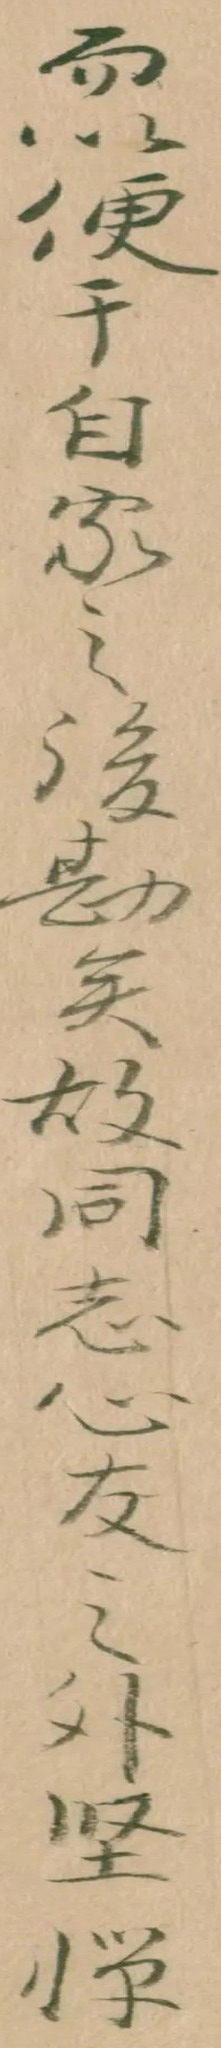而以便于自家之後勘矣故同志心友之外堅憚
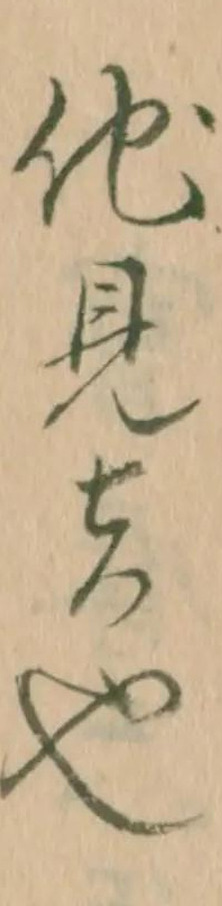他見者也

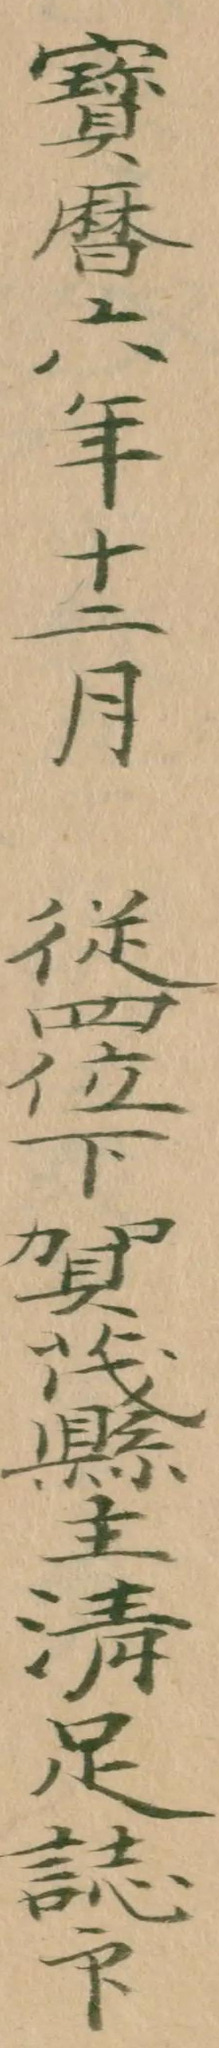宝暦六年十二月従四位下賀茂県主清足誌印
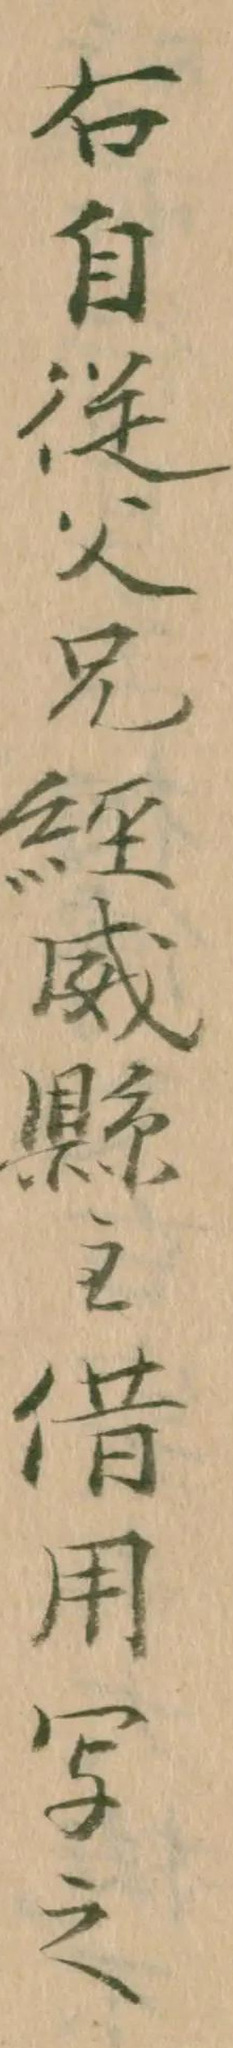右自従父兄経威県主借用写之
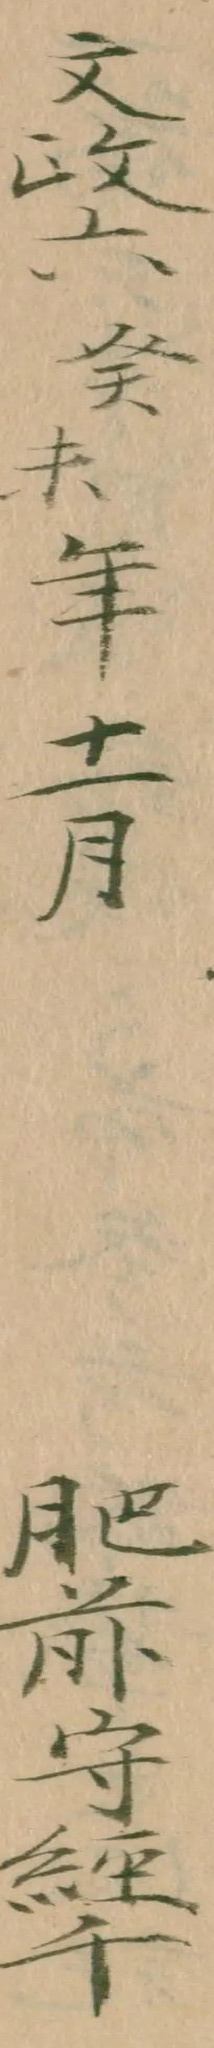文政六癸未年十一月肥前守経千
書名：賀茂社記録. 第26冊
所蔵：国立国会図書館 National Diet Library, JAPAN
